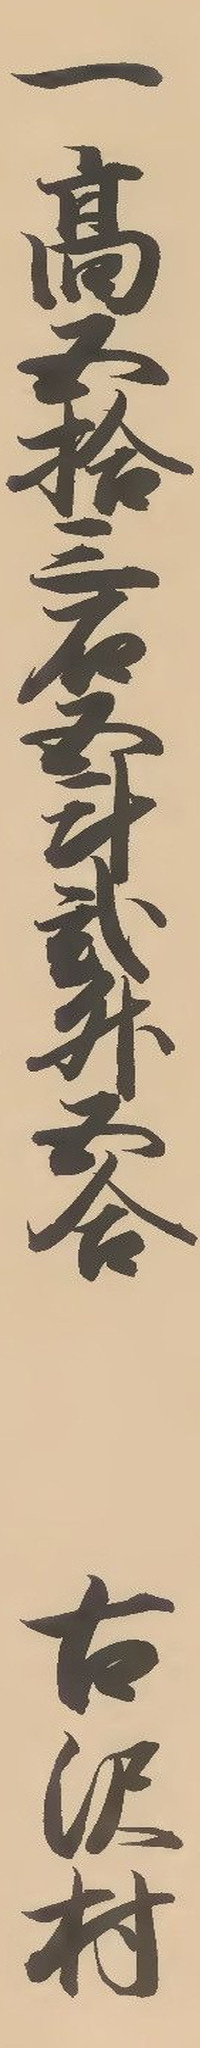一高五拾三石五斗弐升五合古沢村
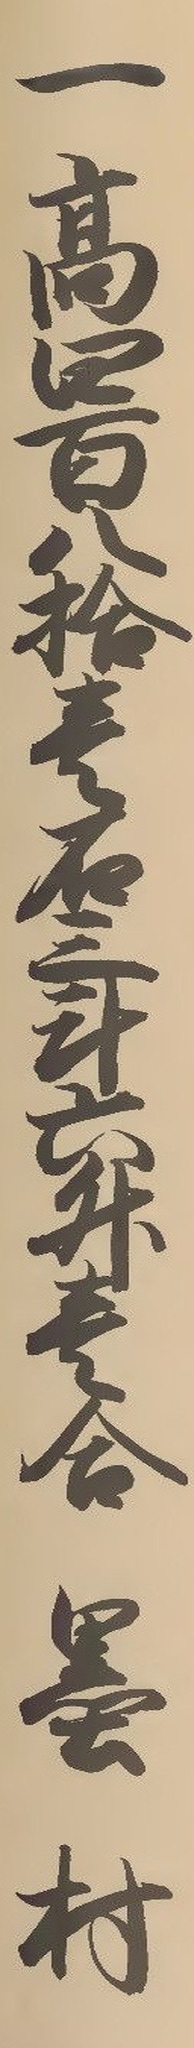一高四百八拾壱石三斗六升壱合墨村
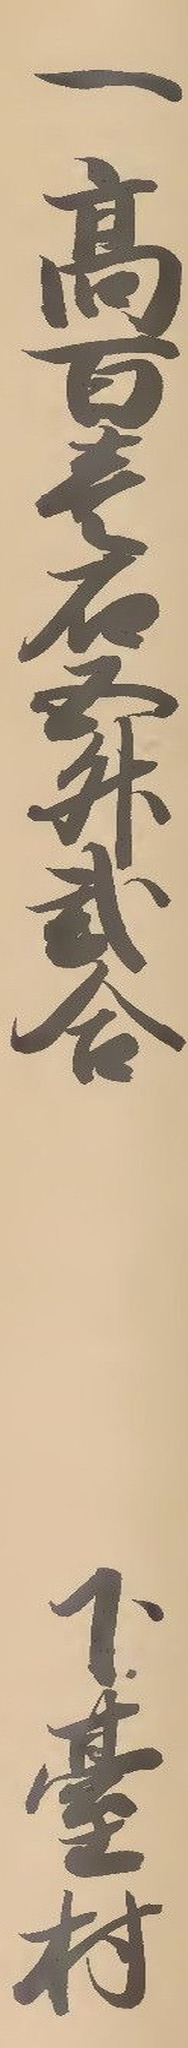一高百壱石五升弐合下台村
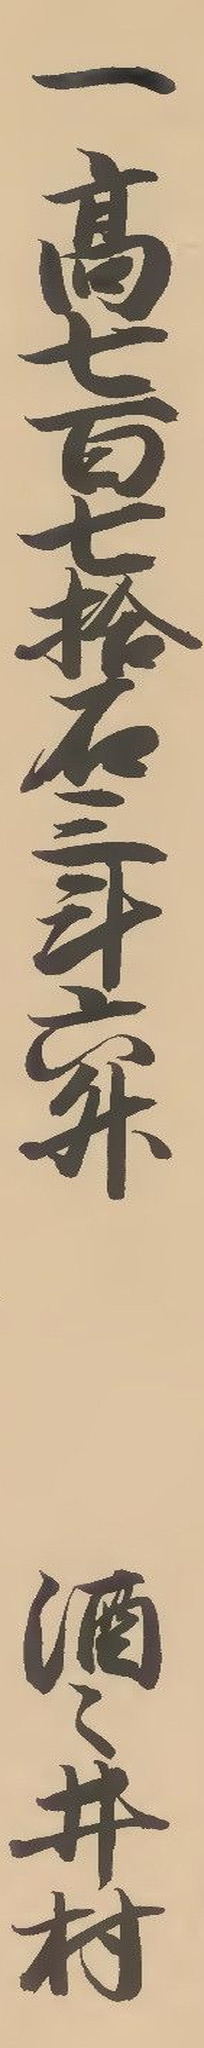一高七百七拾石三斗六升酒々井村
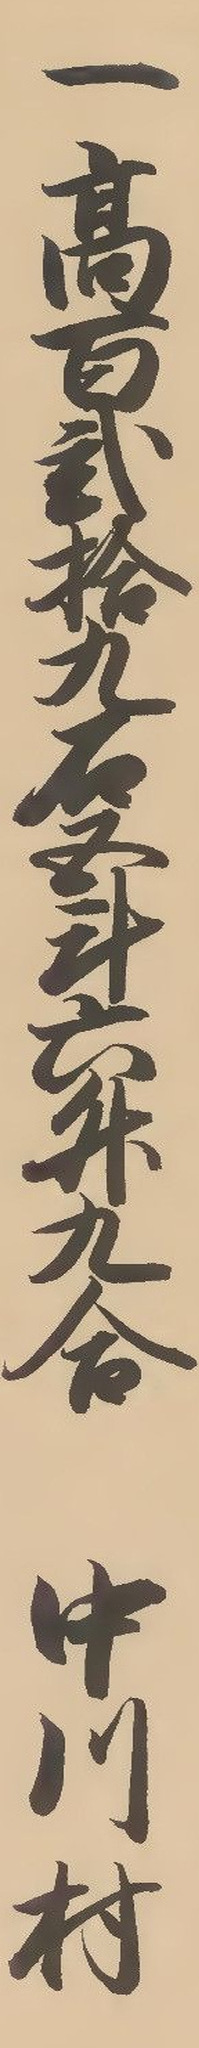一高百弐拾九石五斗六升九合中川村
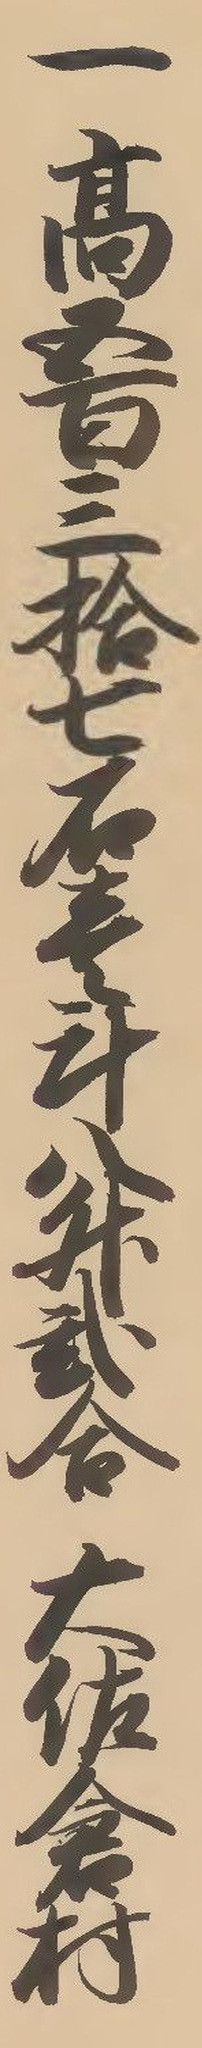一高五百三拾七石壱斗八升弐合大佐倉村

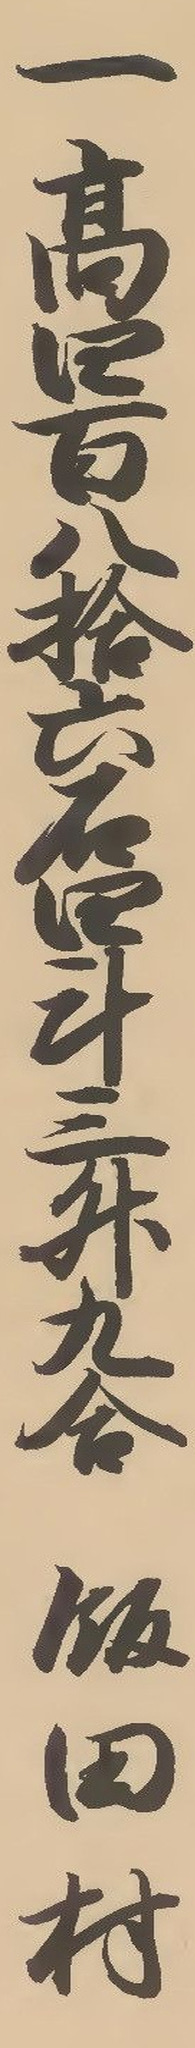一高四百八拾六石四斗三升九合飯田村
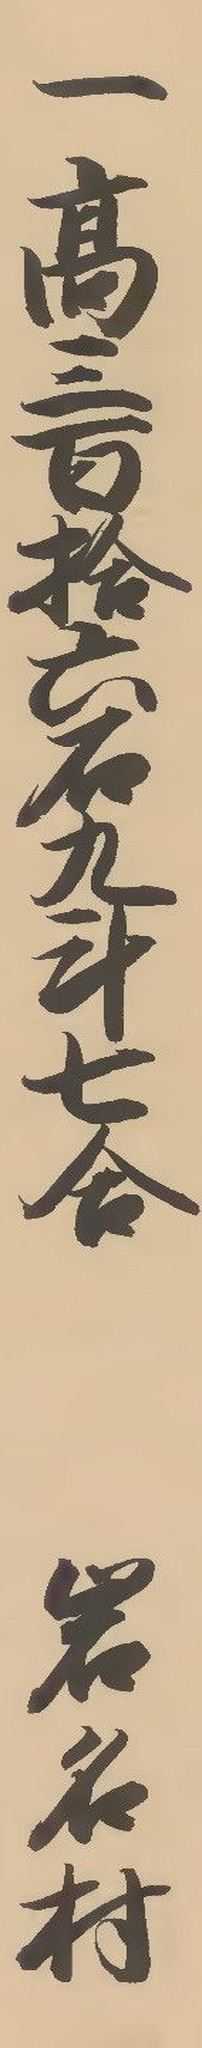一高三百拾六石九斗七合岩名村
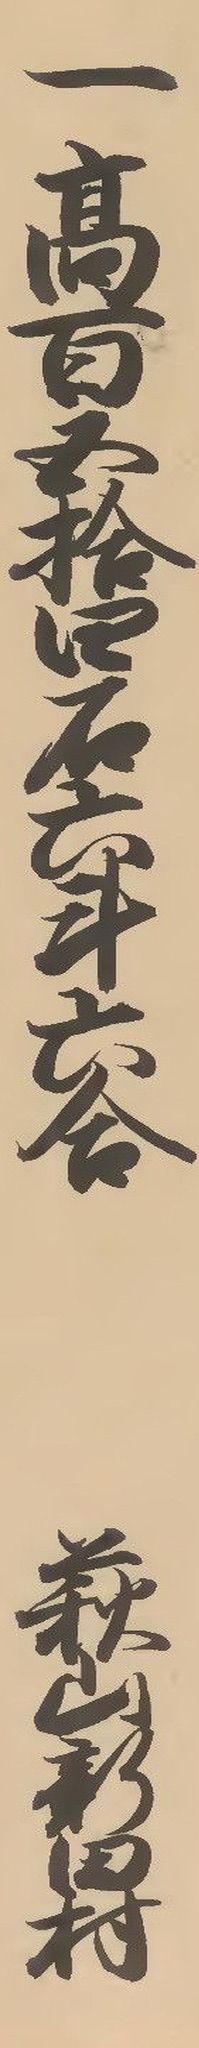一高百五拾四石六斗六合萩山新田村
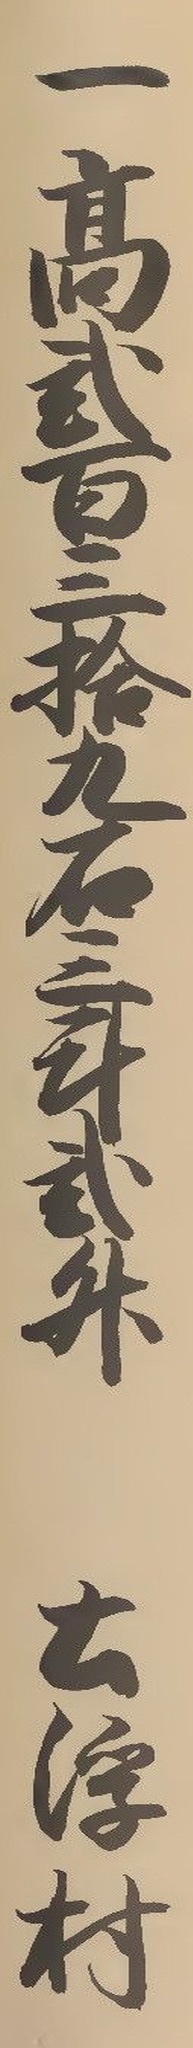一高弐百三拾九石三斗弐升土浮村
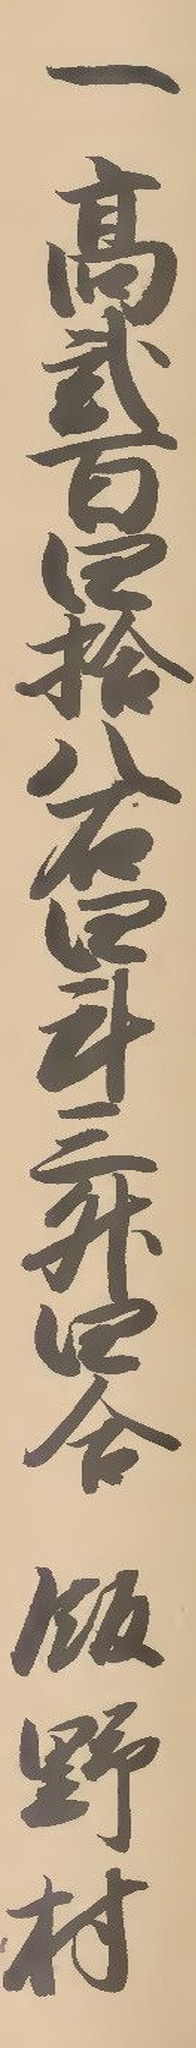一高弐百四拾八石四斗三升四合飯野村
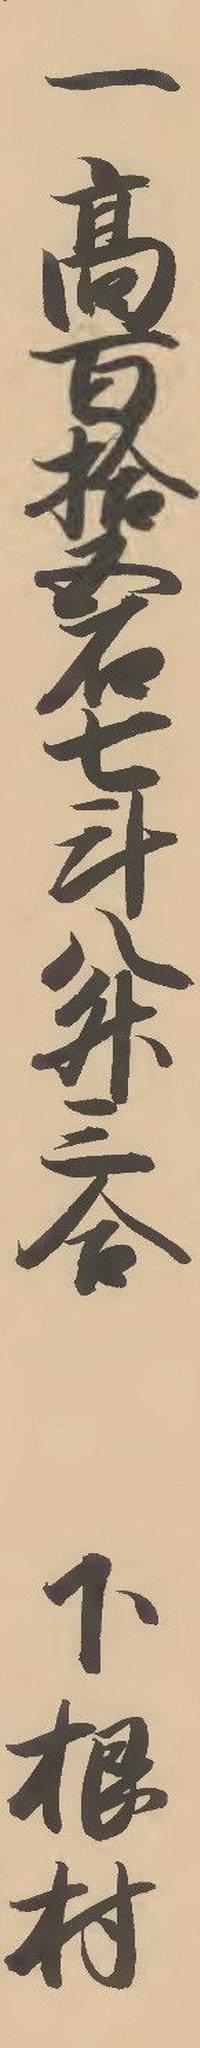一高百拾五石七斗八升三合下根村
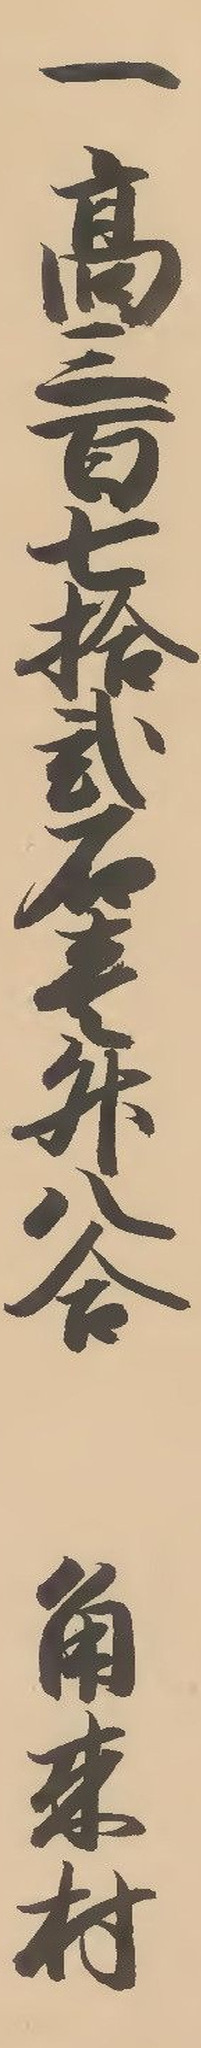一高三百七拾弐石壱升八合角来村
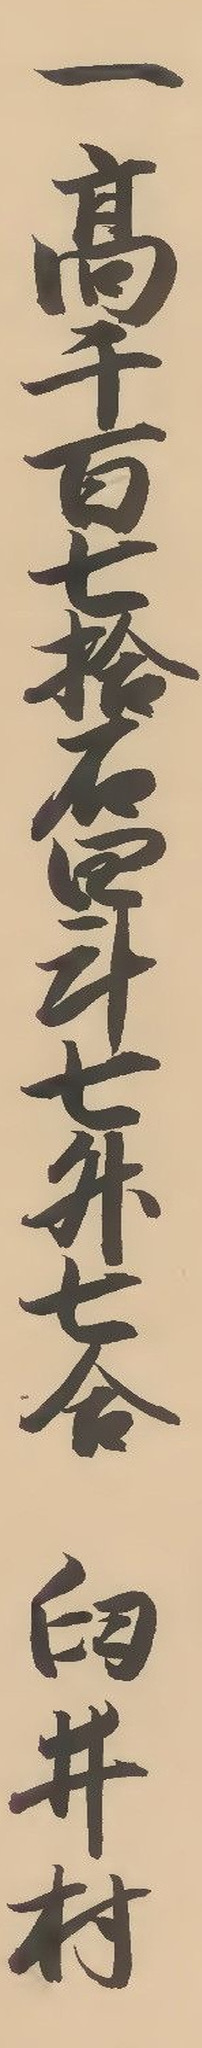一高千百七拾石四斗七升七合臼井村

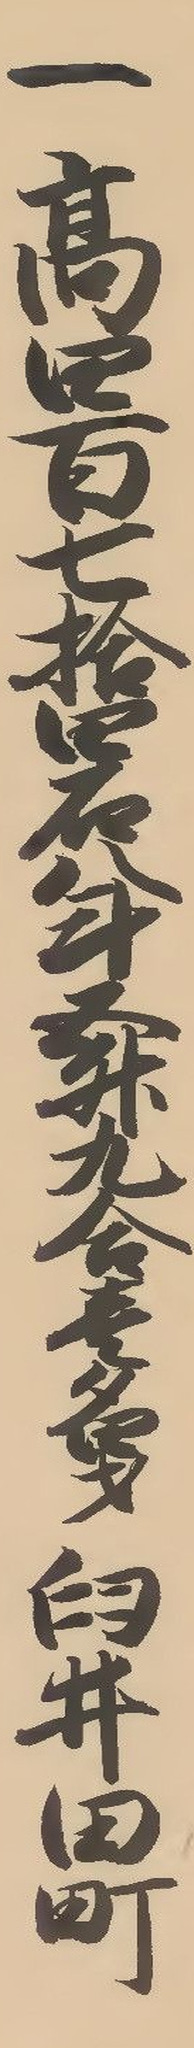一高四百七拾四石八斗五升九合壱勺四才臼井田町
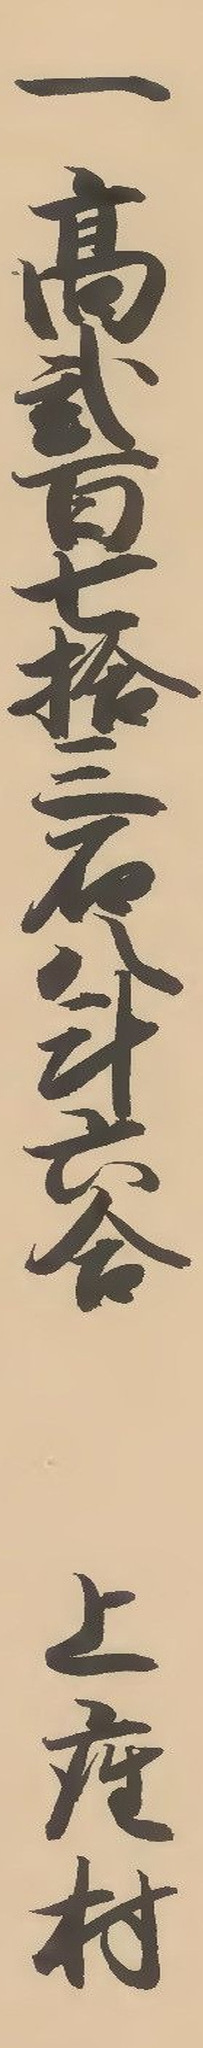一高弐百七拾三石八斗六合上座村
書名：下総国郷帳
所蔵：国立公文書館 National Archives of Japan
